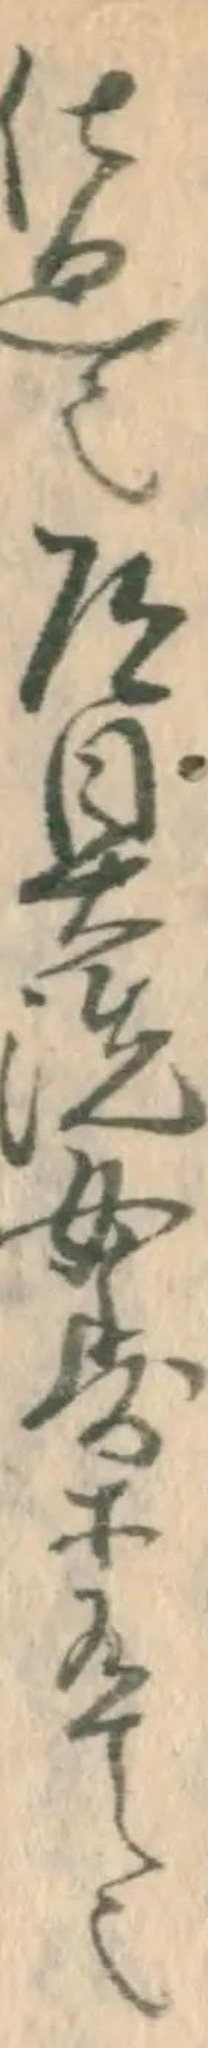仕廻也道具洗女歩等有之也
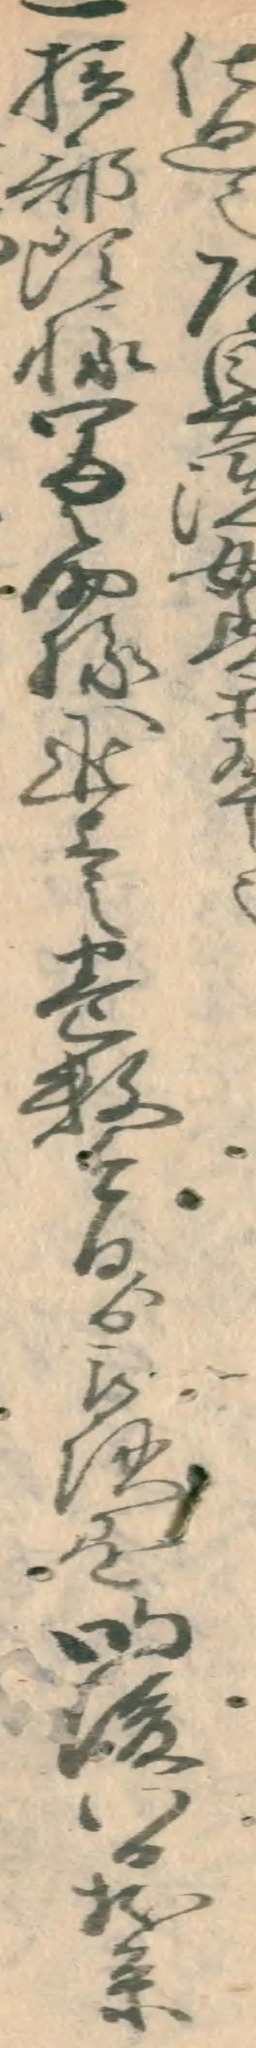一掃部頭様富之助様へ進上之巻数今日ゟ被認懸明後八日持参
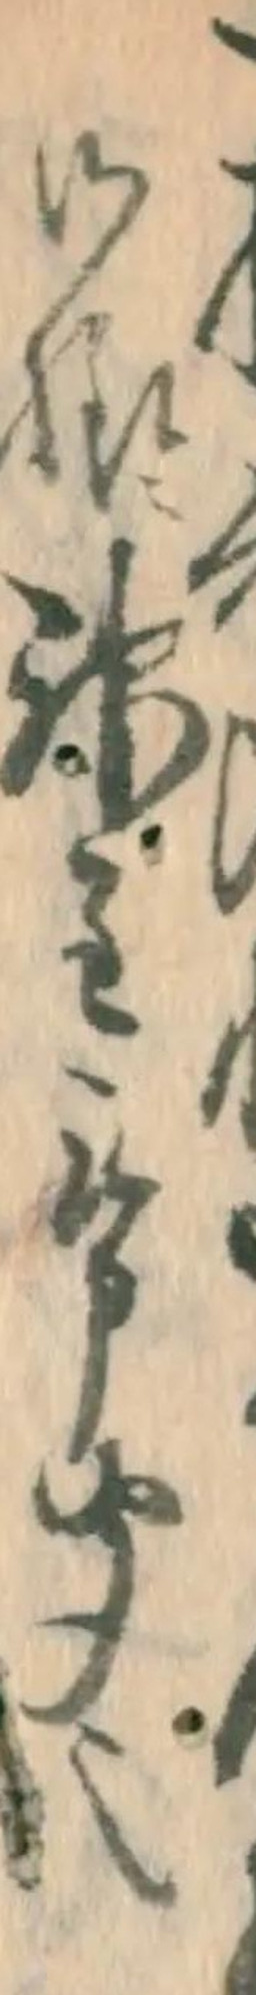候様ニ神主被申聞也
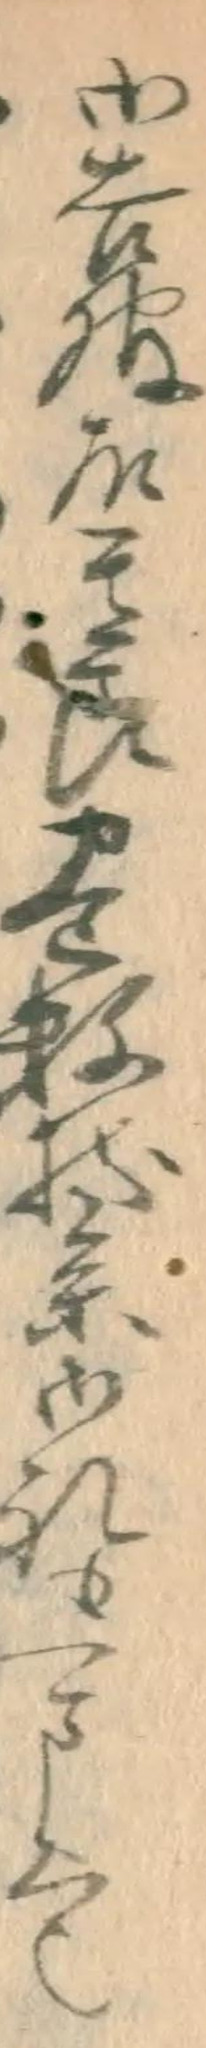御吉服故其節巻数持参御礼も可申上也
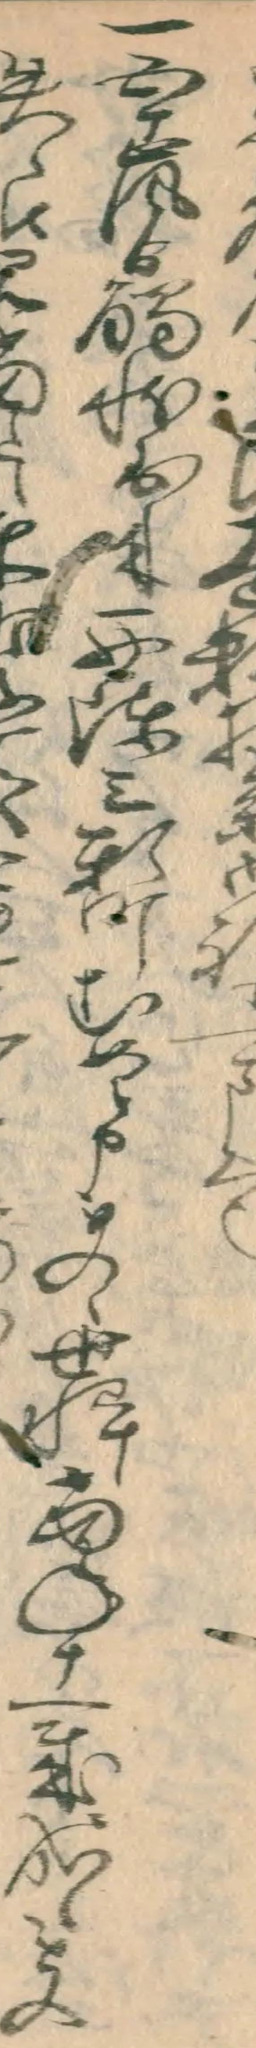一五十嵐ゟ触状到来西陣三軒町むめと申ものゝ世忰当年十一歳ニ成候もの
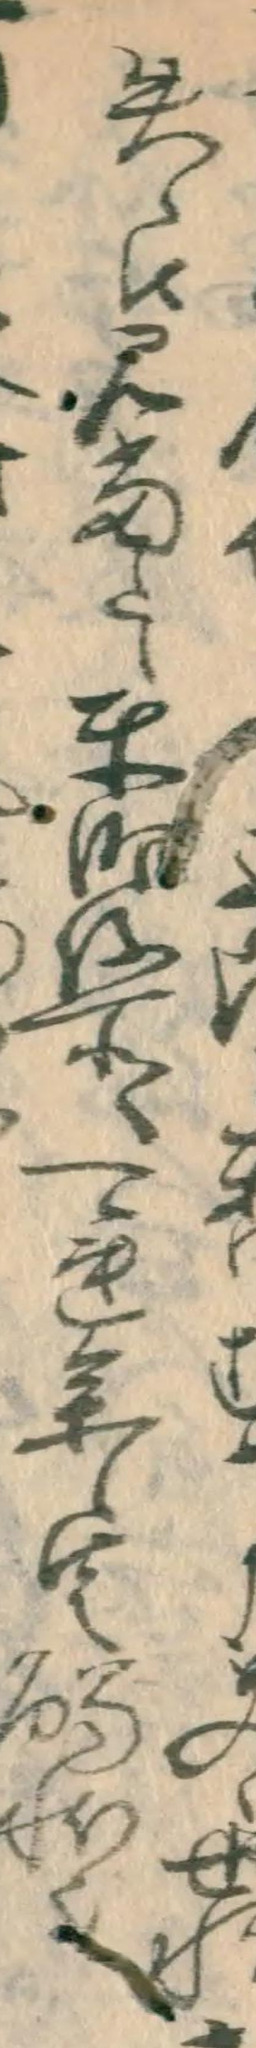失候由見当候ハヽ東御役所へ可連参候由之触状也
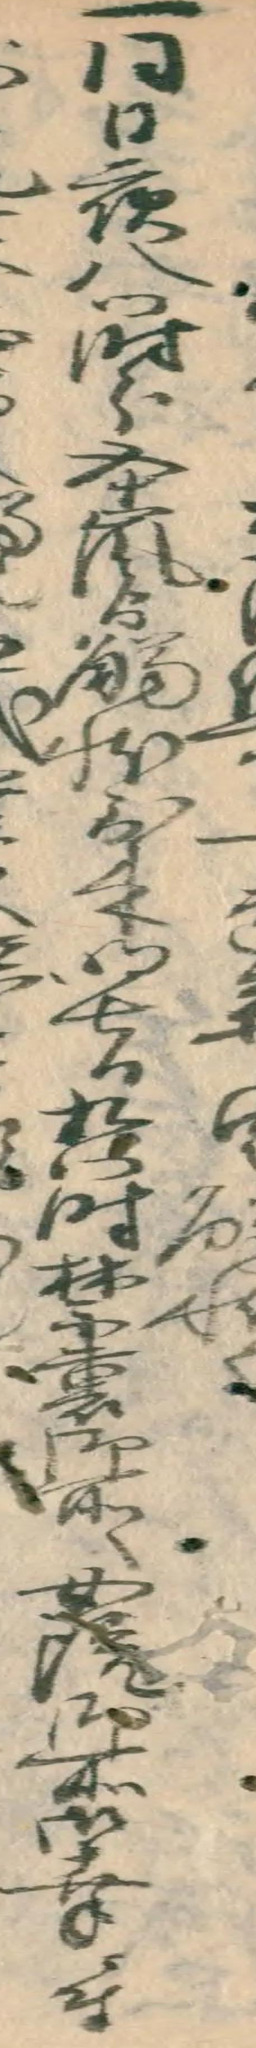一同日夜八ツ時分五十風ゟ触状到来明七日九ツ時禁裏御所へ女院御前御幸ニ付
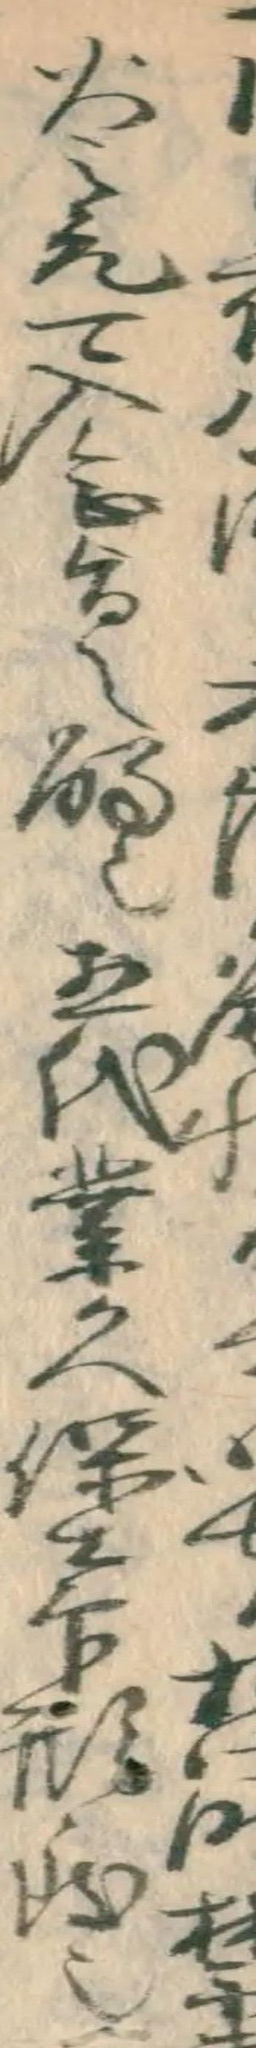火之元可入念旨之触也惣代業久保土印形致也
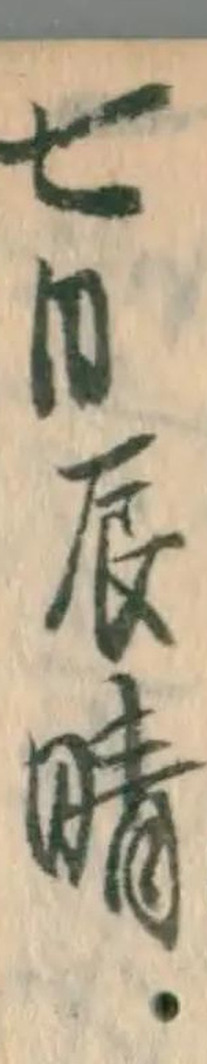七日辰晴
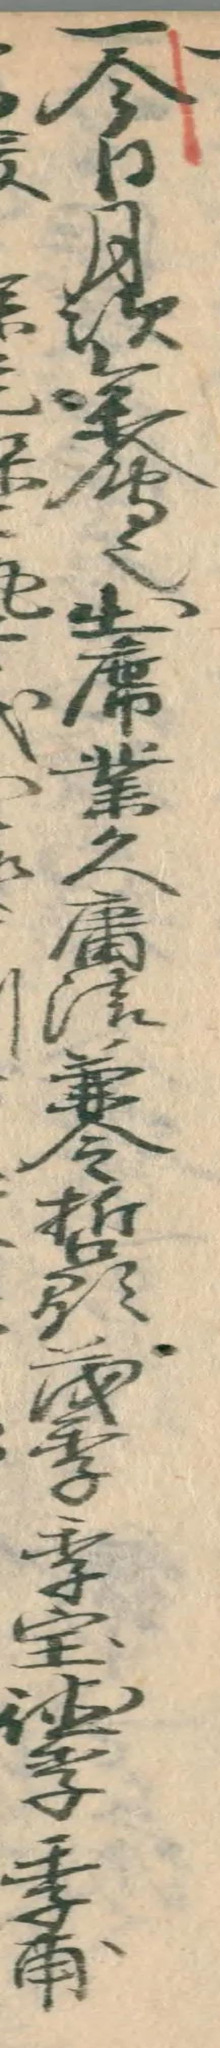一今日月次参会也出席業久庸清兼令哲顕茂季季宝徳季季甫
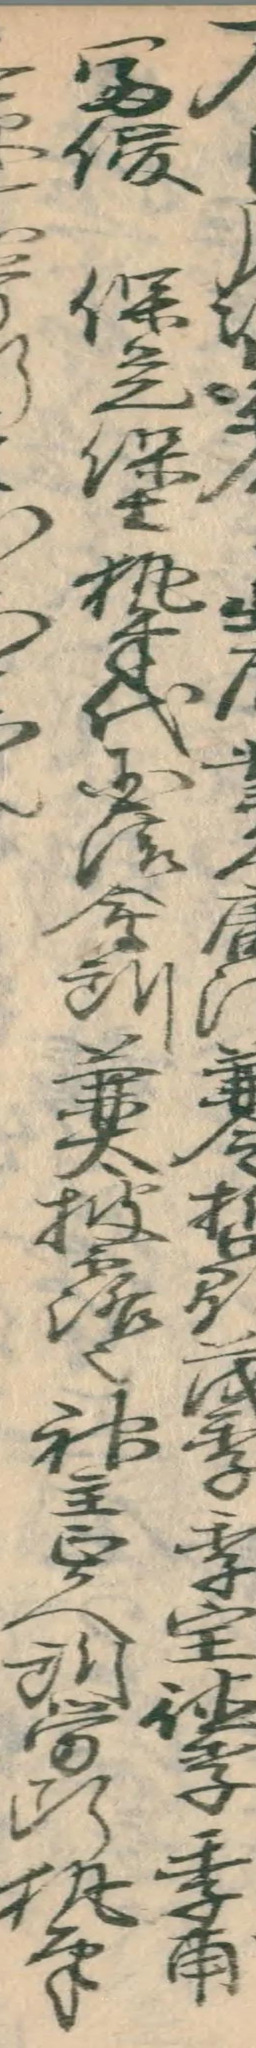富俊保覚保土執筆代国清会所兼太披露也神主正久所労断執筆
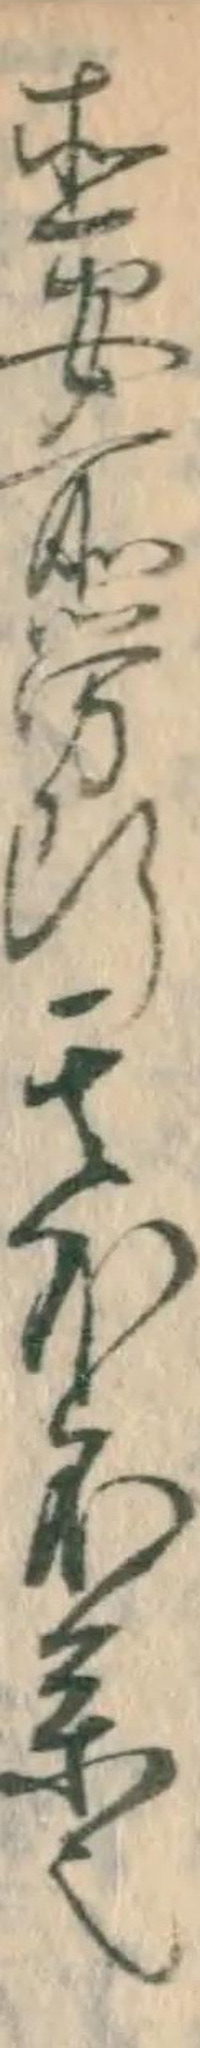直安所労断其外不参也
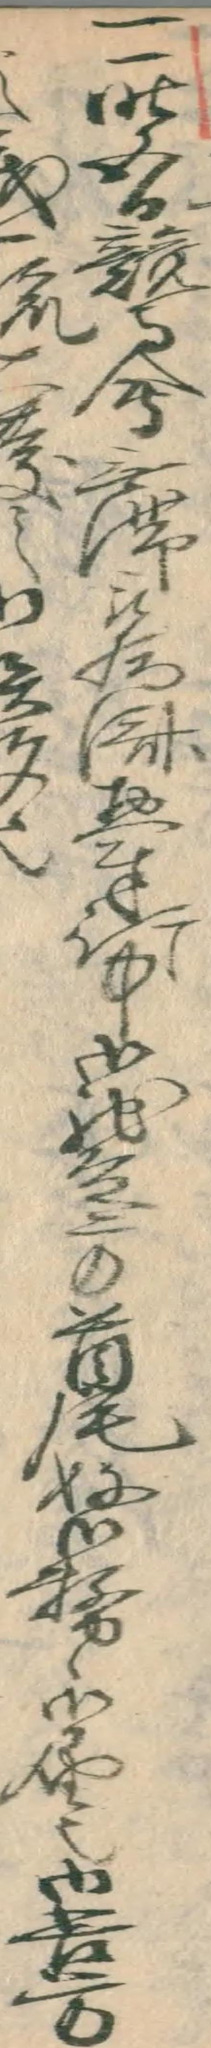一一昨五日競馬会無滞被為済惣奉行中御馳走方首尾好御務候御届也御苦労
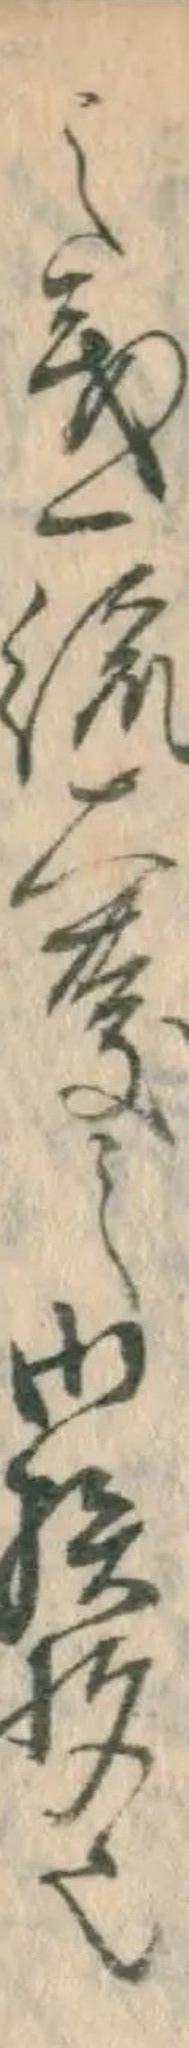之義一統大慶之御挨拶也
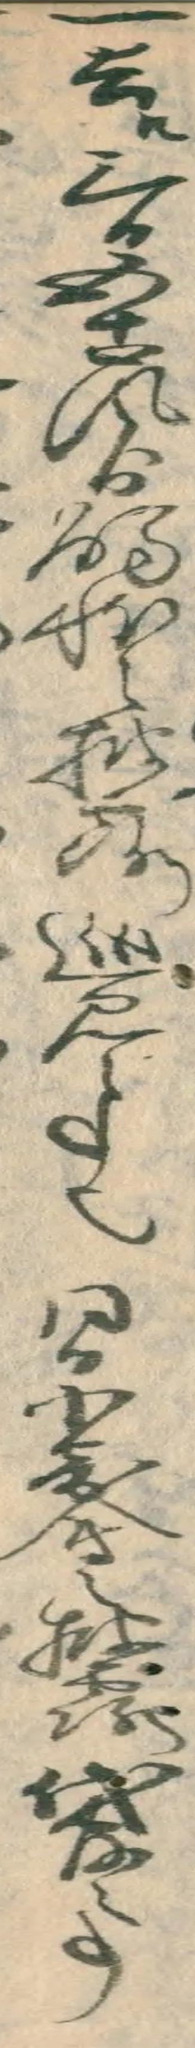一去ル三日五十風ゟ触状之披露巡見之事也同日小寄会之披露代官之事
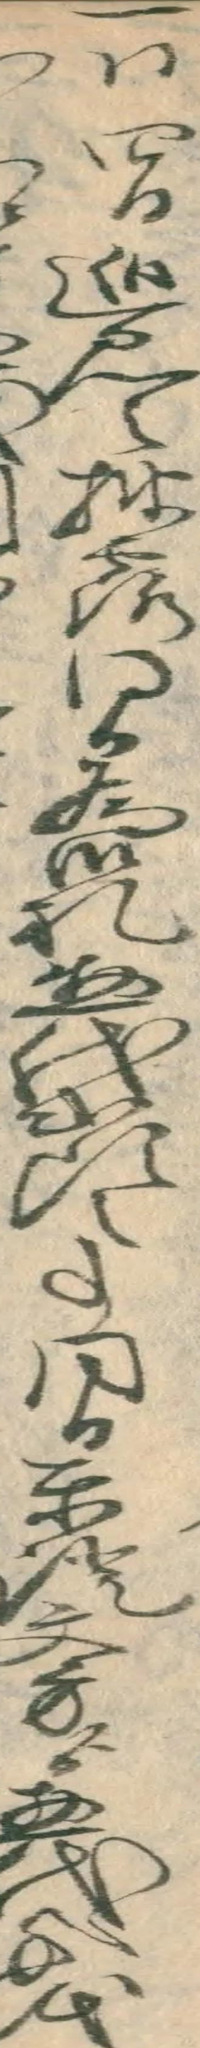一同四日巡見之披露同日為御礼惣代出頭之事同日東証文方ゟ惣代へ手紙
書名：賀茂社記録. 第58冊
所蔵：国立国会図書館 National Diet Library, JAPAN
